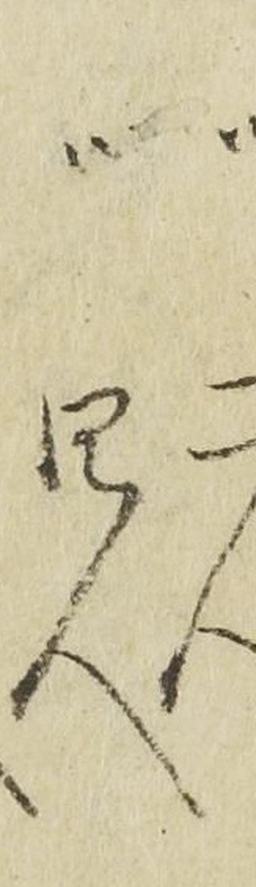同六人
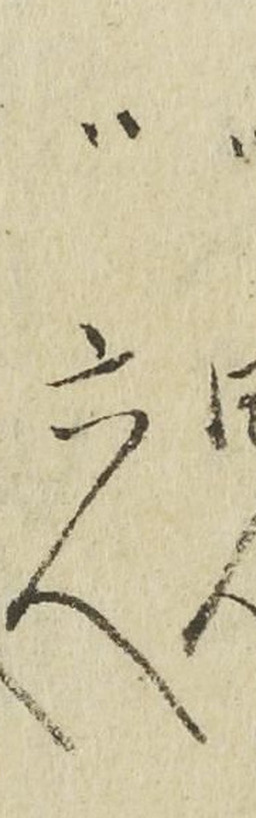同六人
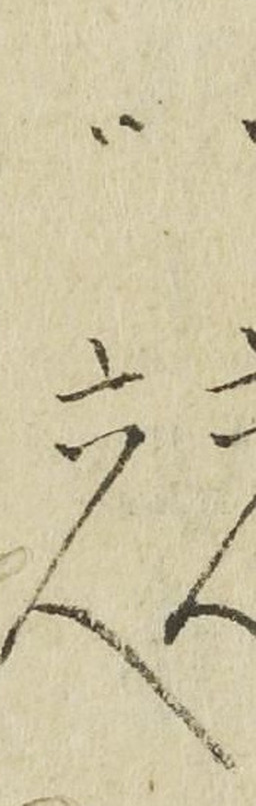同六人

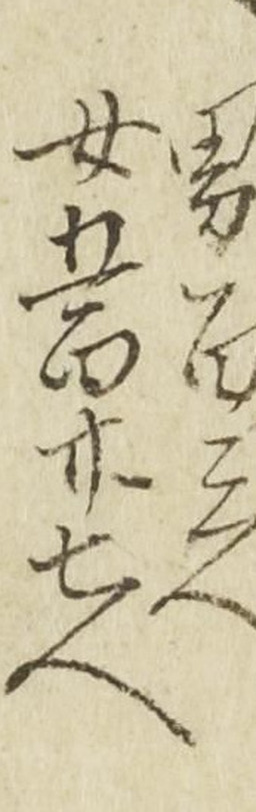女五百廿七人
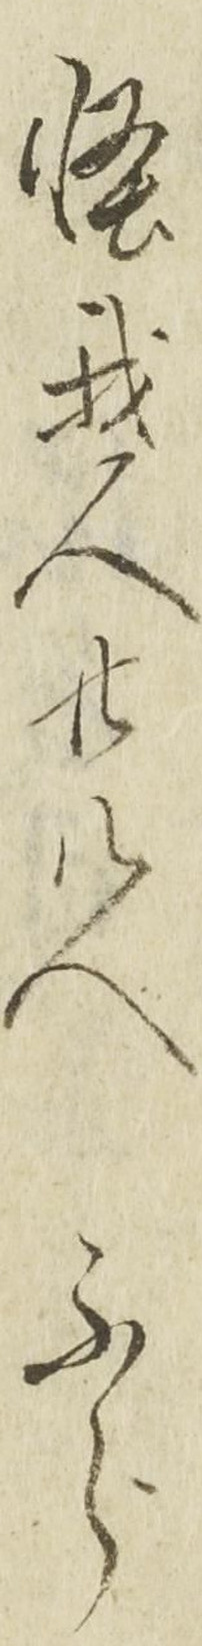怪我人廿八人不分
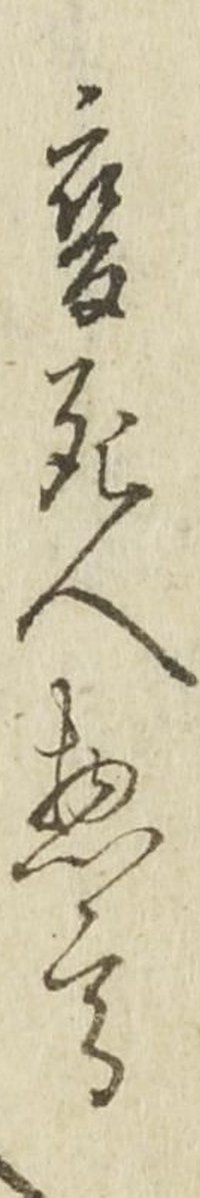変死人惣高
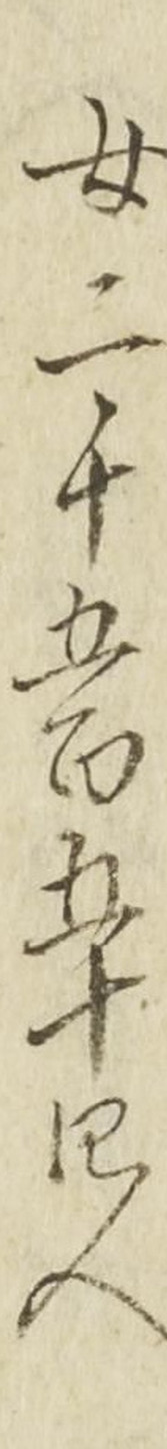女二千五百五十四人
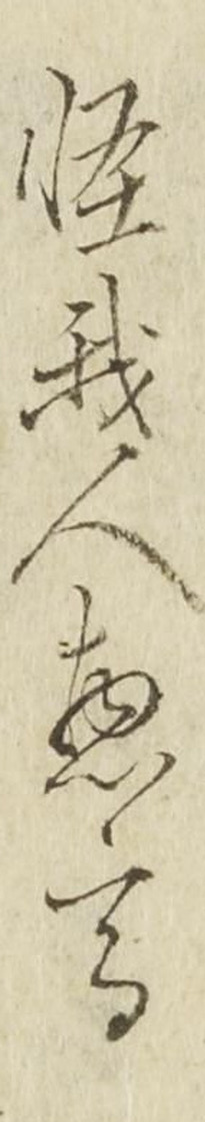怪我人惣高
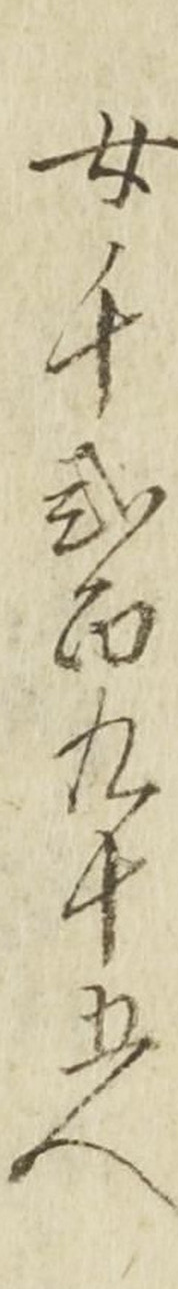女千弐百九十五人
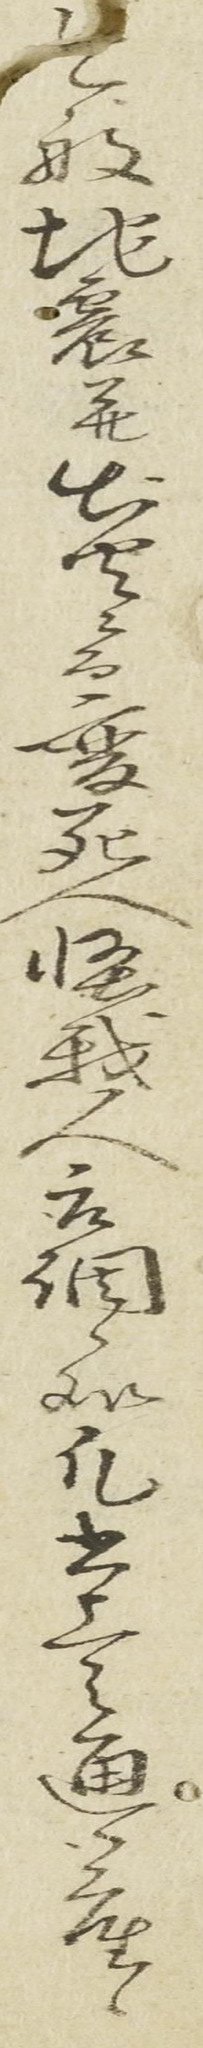今般地震并出火二而変死人怪我人取調候処凡書上之通御座候
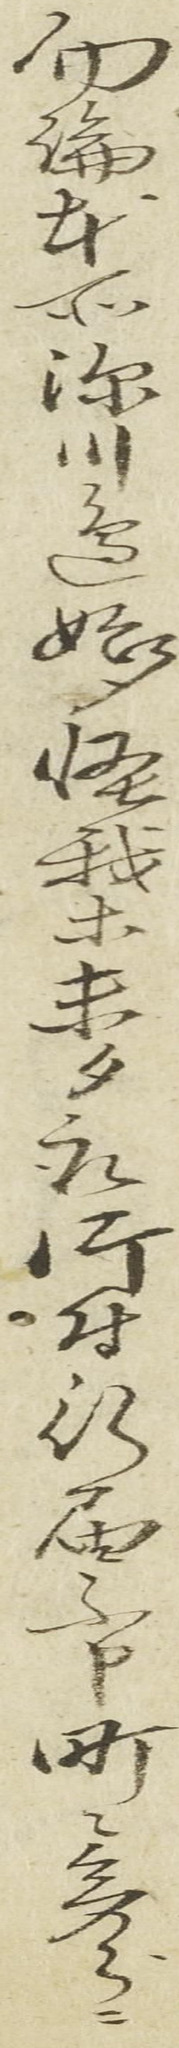勿論本所深川辺始メ怪我等未タ取片付行届不申町々多分ニ
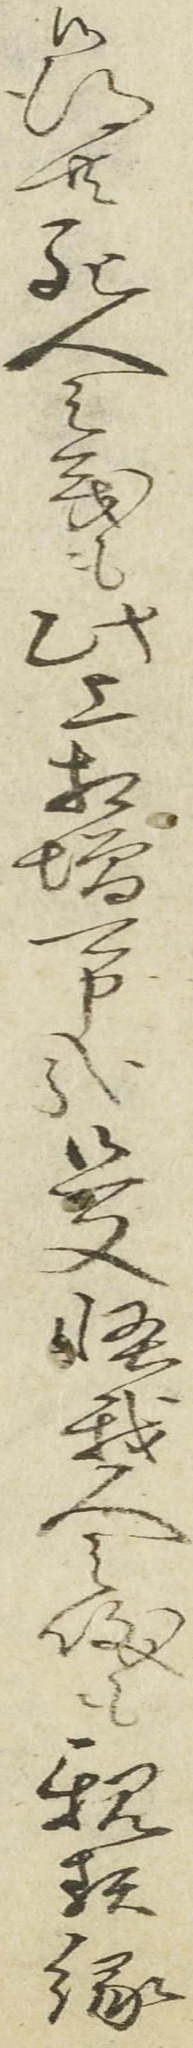候得共死人の義も此上相増可申屋哉且又怪我人之儀も親類縁
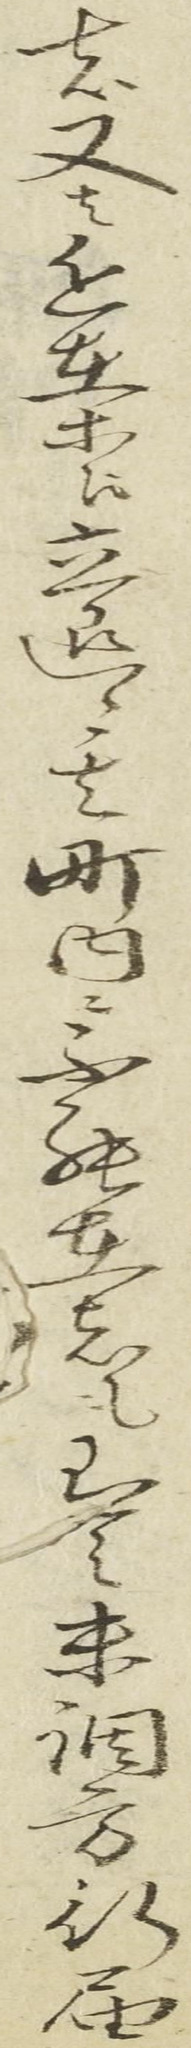者又は近在等え立退候其町内に不罷在者も有之未調方行届
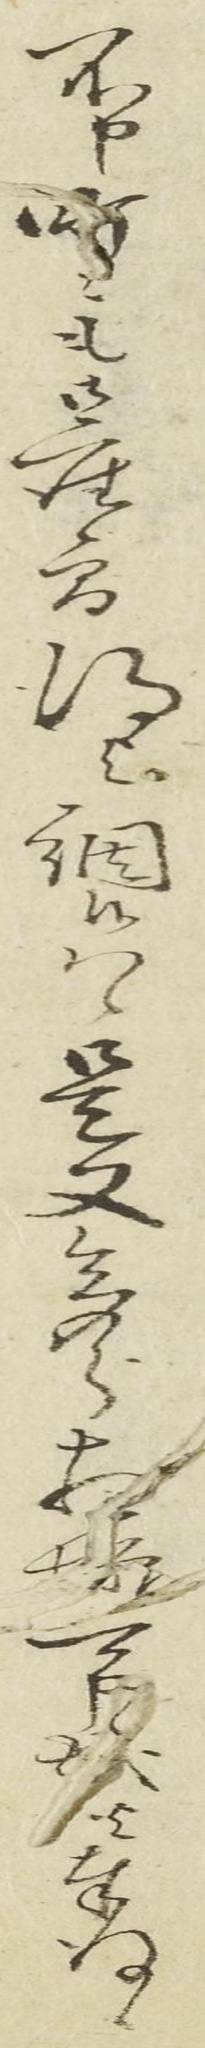不申町ニも御座候間得と調候ハゝ是又多分相増可申哉と奉存候
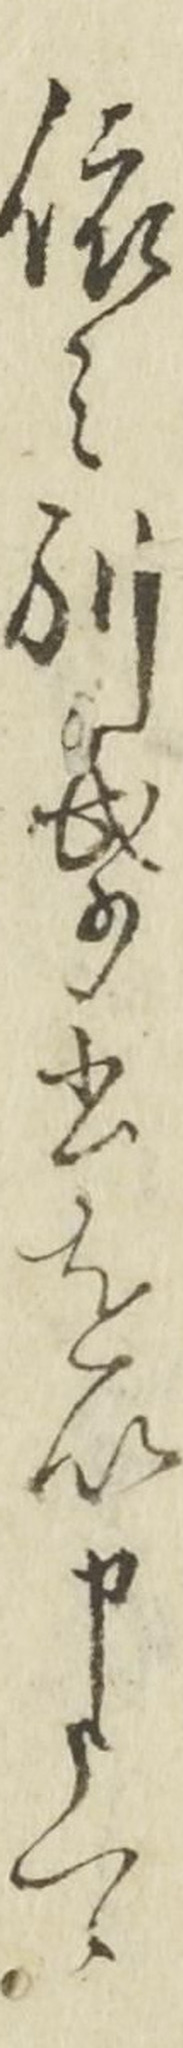依之別紙書を以申上候
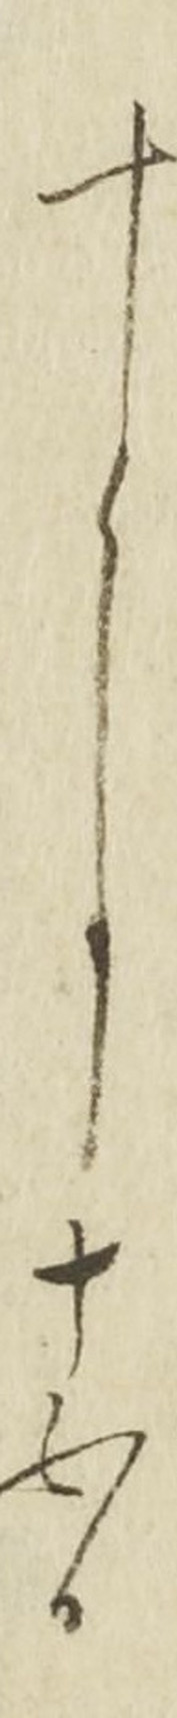十月十五日
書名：安政二乙卯年十月二日大地震之事
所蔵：東京大学地震研究所図書室 Earthquake Research Institute Library, The University of Tokyo, JAPAN
